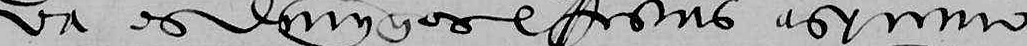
va os domȳgos e festas asy como
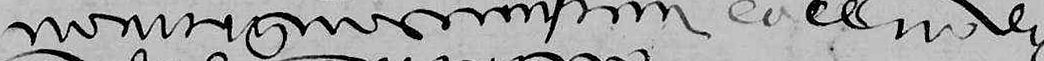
no artyguo se contem e all nō dy
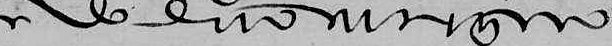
se do dito artyguo
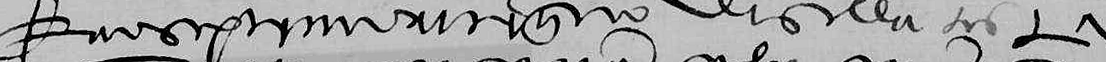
item ao septymo artyguo dis ella testa
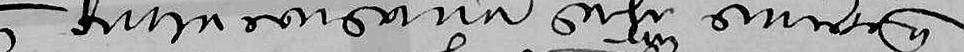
q̄ outra cousas nā sabe somēte q̄
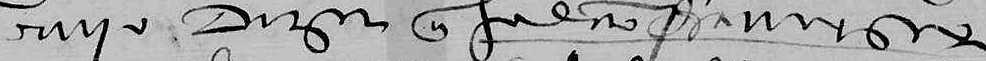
ouujo Dizer q̄ ho dito dom francysco
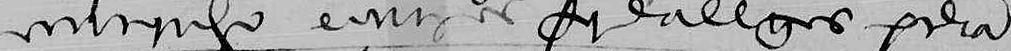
coutynho e outros fydalgos pediā
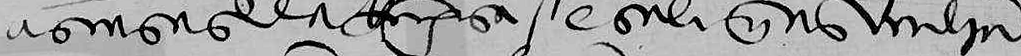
as casas da Re p̄sa / e sabe q̄ as venderā
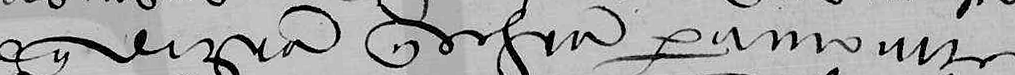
e q̄ dizyā q̄ se hyā ꝑa momte
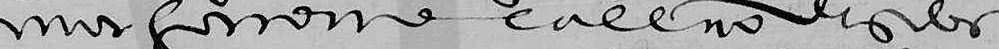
mor ho nouo e all nō dise dos
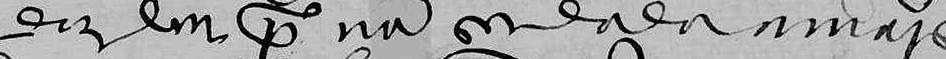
diz dom p̄o nā ser dada a majs
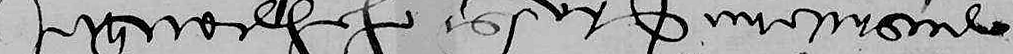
Jorge coelho ho esp̄vy com o rryscado
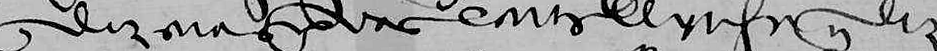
q̄ diz suas ep̄vas e antrellynha q̄ diz
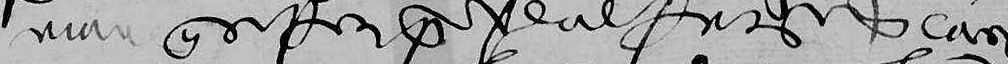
may q̄ se fez p̄o ꝟdade fazer e asy
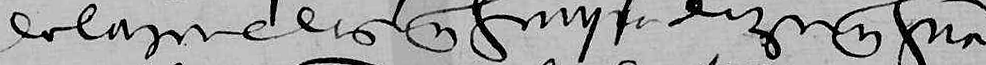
declarou e dise q̄ houuyra diser q̄ huā
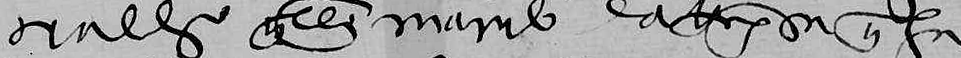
tya de djo gl̄lz marydo da Re p̄sa q̄ ha
